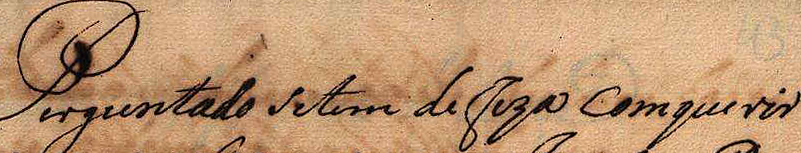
Perguntado se tem defeza com que vir
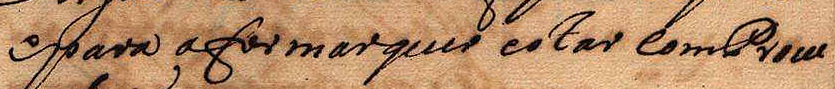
e para o formar quer estar com Procu
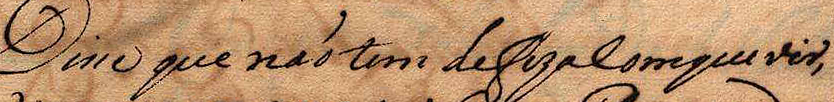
Disse que naõ tem defeza com que vir,
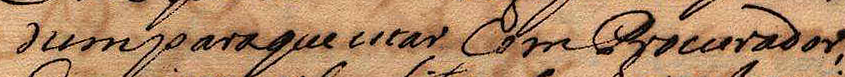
nem para que estar Com Procurador,
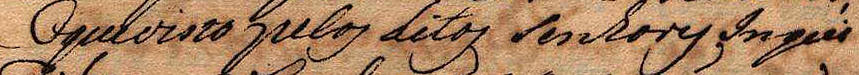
O que visto pelos ditos senhores Inqui
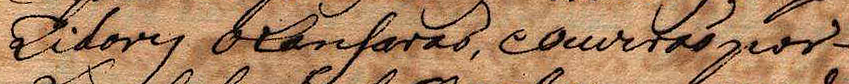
zidores o lansaraõ, e ouviraõ por
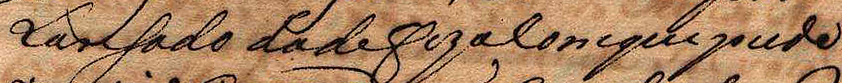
Lansado da defeza com que pude
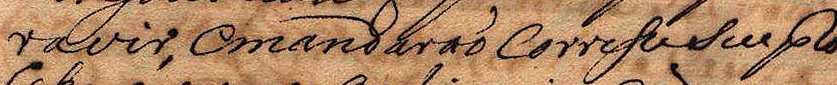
ra vir, e mandaraõ corresse seu pRo
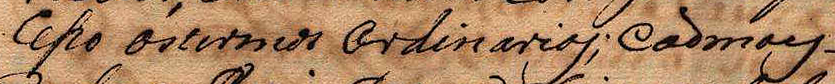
cesso os termos Ordinarios; e admoes
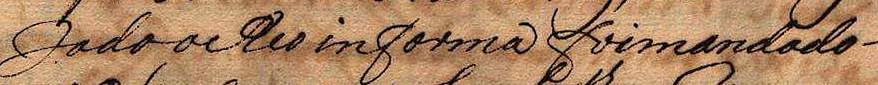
tado o Reo in forma foi mandado
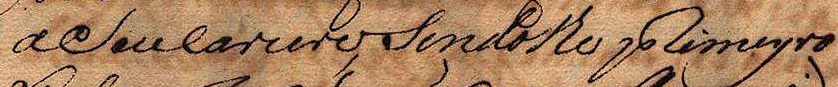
a Seu carcere, Sendolhe primeyro
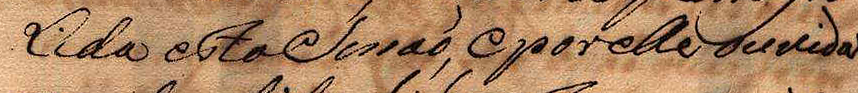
Lida esta Sessaõ, e por elle ouvida
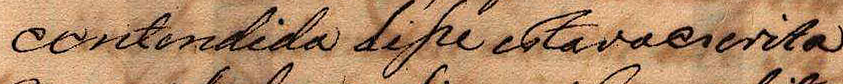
e entendida disse estava escrita
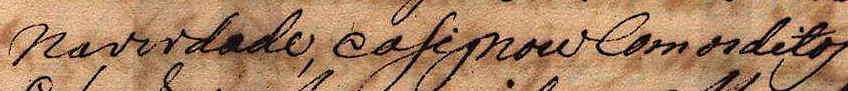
na verdade, e asignou com os ditos
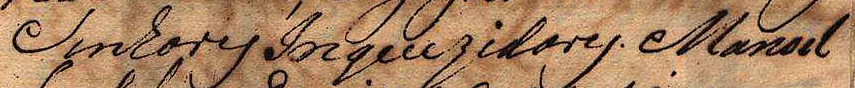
Senhores Inquezidores Manoel
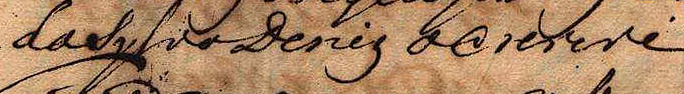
da Sylva Deniz o escrevi
